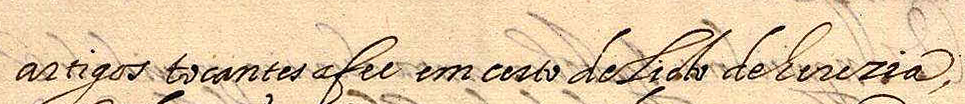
artigos tocantes a fee em certo delicto de herezia,
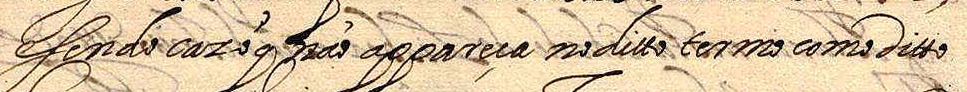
e sendo cazo q̄ não appareça no ditto termo como ditto
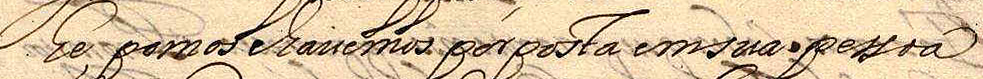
he, pomos e hauemos por posta em sua pessoa
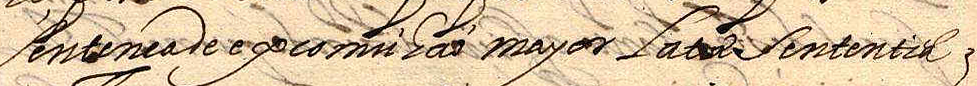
sentença de excomuhaõ mayor latæ sententiæ
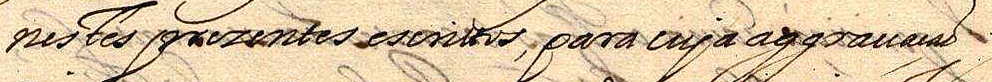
nestes prezentes escrittos, para cuja aggrauaçaõ
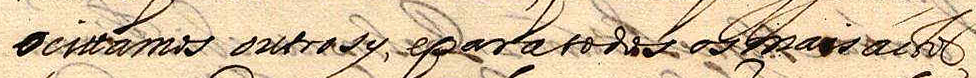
o cittamos outrosy, e para todos os mais actos
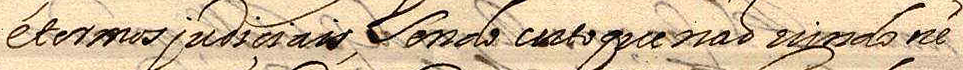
e termos judiciais, sendo certo que naõ uindo nē
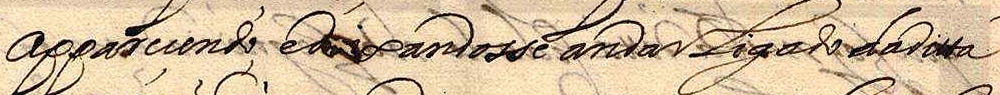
apparecendo, e deixandosse andar ligado da ditta
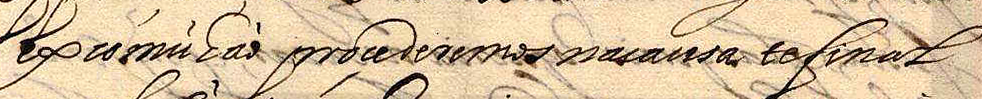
excomuhaõ procederemos na causa te final
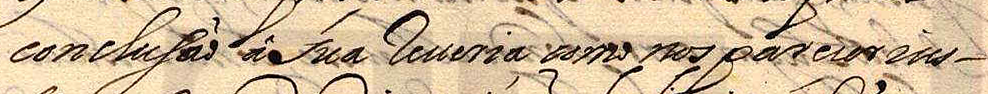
conclusão â sua Reueria, como nos parecer ius
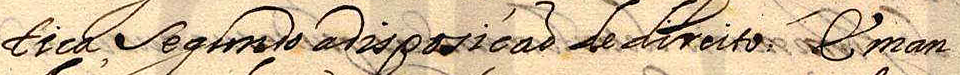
tiça segundo a disposiçaõ de direito. E man
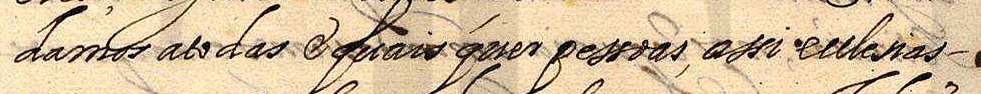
damos a todas e quaisquer pessoas, assi ecclesias
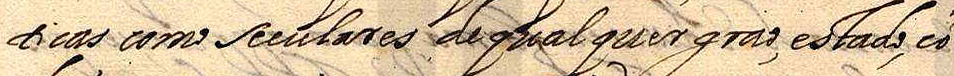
ticas como seculares de qualquer grao, estado, cō
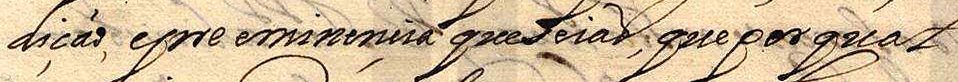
dição, e preeminencia que seiaõ, que por qual
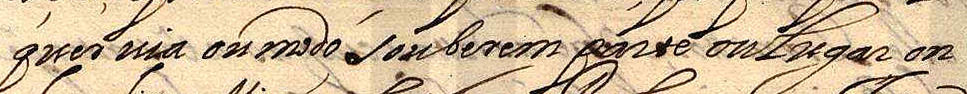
quer uia ou modo souberem parte ou lugar on
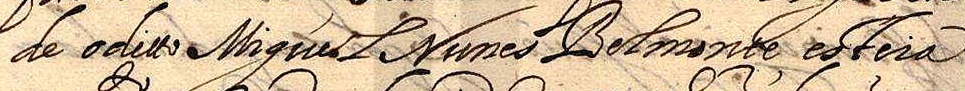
de o ditto Miguel Nunes Belmonte esteia
